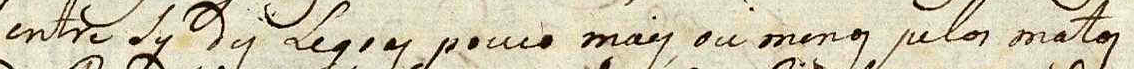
entre sy des Legoas pouco mais ou menos pelos matos
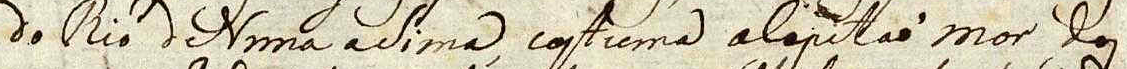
do Rio de Vnna aSima, costuma o Capitaõ Mor dos
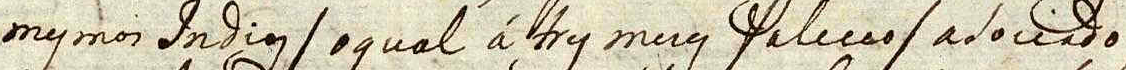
mesmos Indios / o qual á tres meses faleceo/ asociado
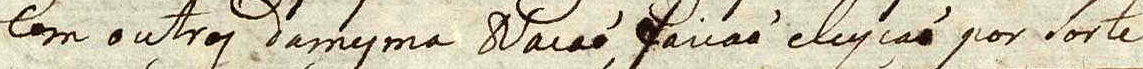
com outros da mesma Nação, faziaõ eleyçaõ por sorte
